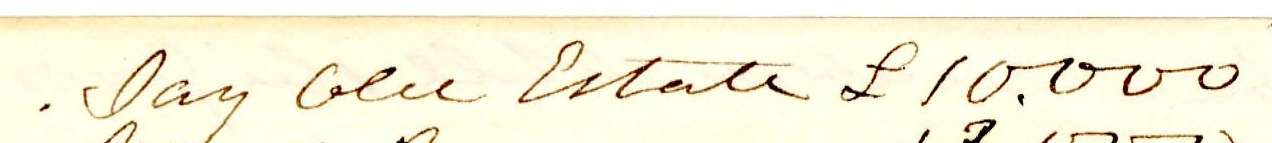Say old Estate £10.000
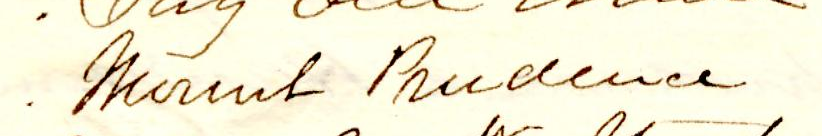Moment Prudence
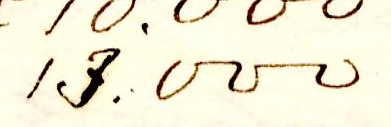13.000
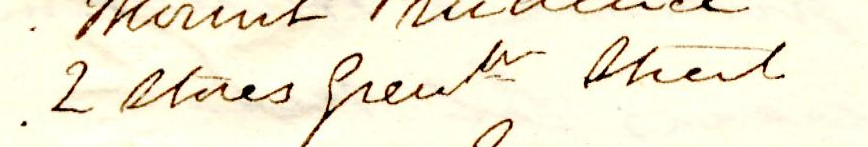2 stores grea^r sheet
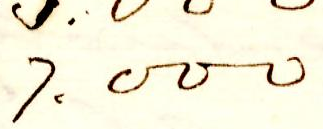7000
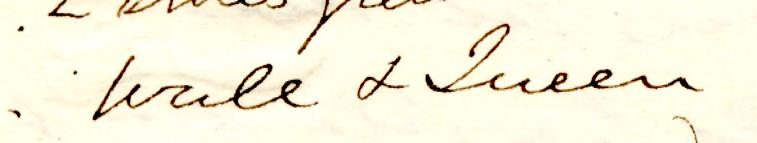wall & Queen
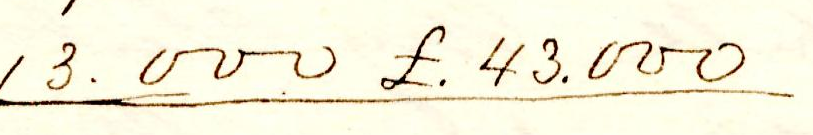13.000 £43.000
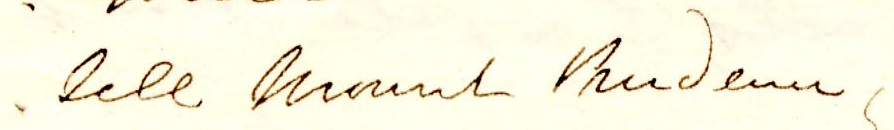sell moment Prudence
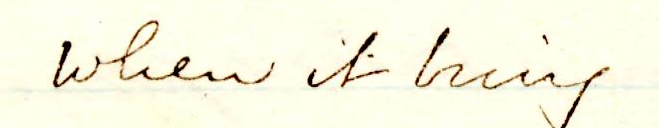when it bring
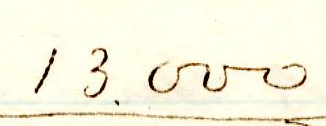13.000
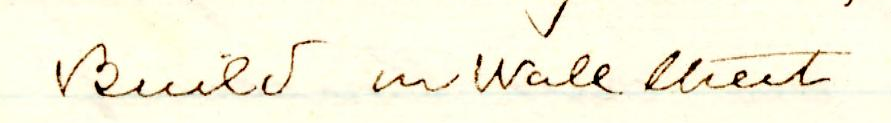Build in wall street
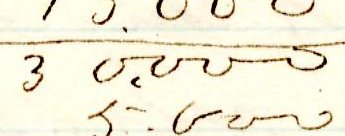30.000
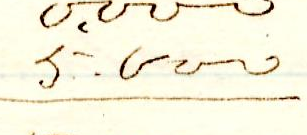5.000
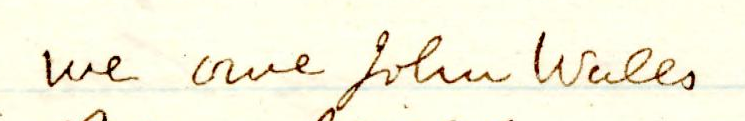we care John Walls
